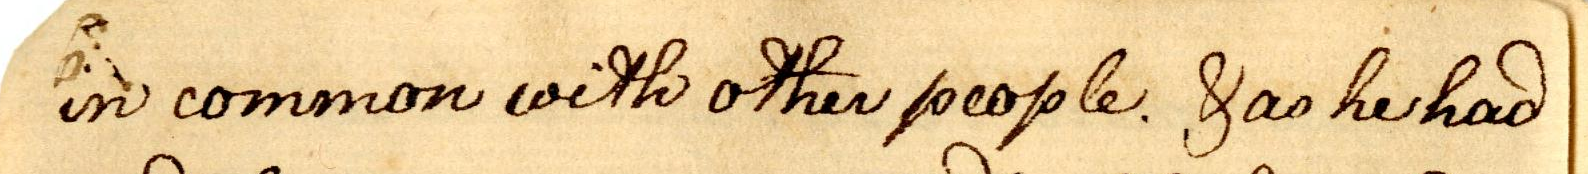in common with other people. & as he had
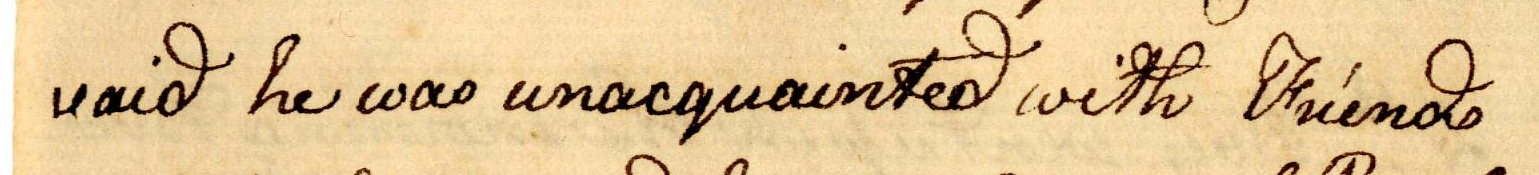said he was unacquainted with Friends
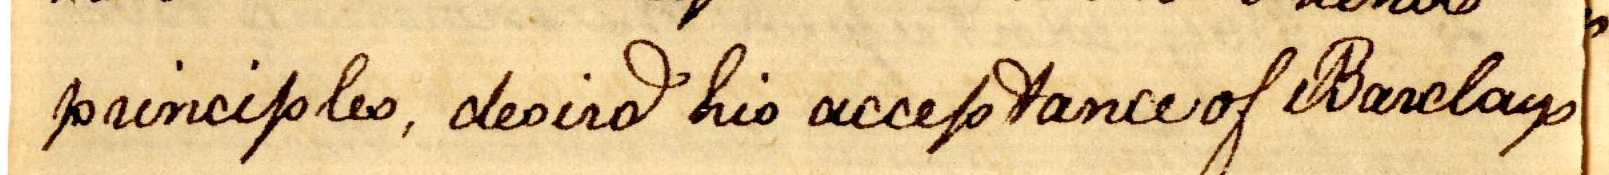principles, desired his acceptance of Barclays
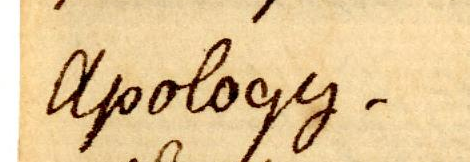Apology.-
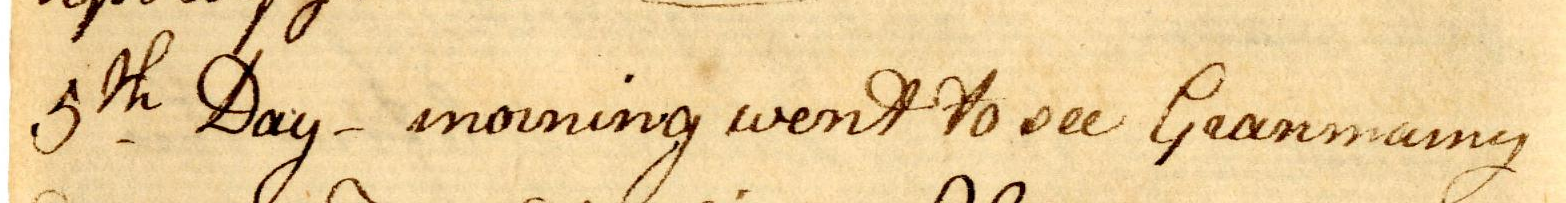5^th Day- morning went to see Granmamy
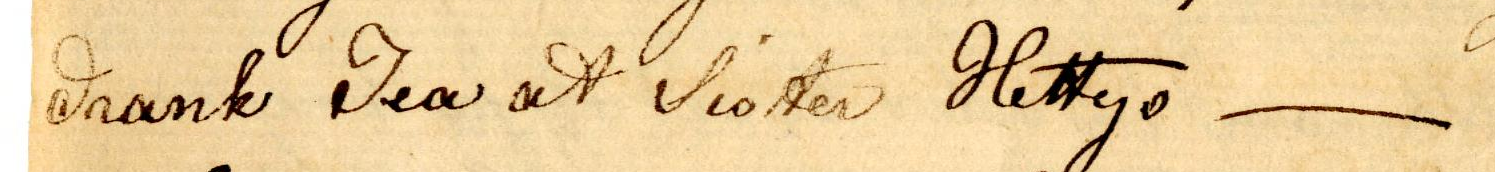drank Tea at Sister Hettys-
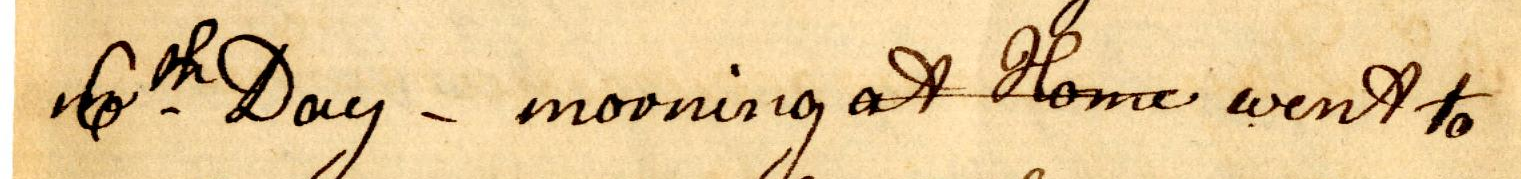6^th. Day- morning [at Home] went to
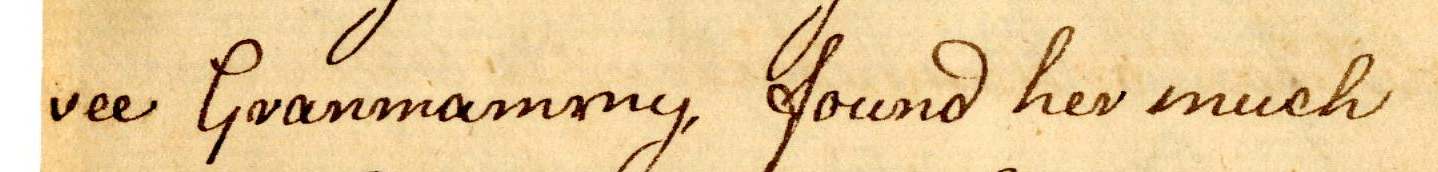see Granmammy, found her much
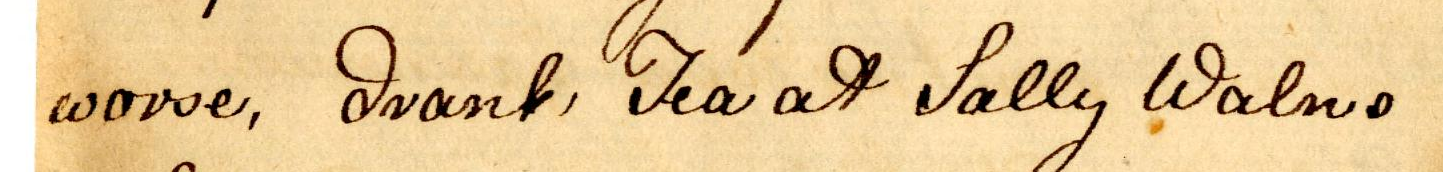worse, drank Tea at Sally Walns
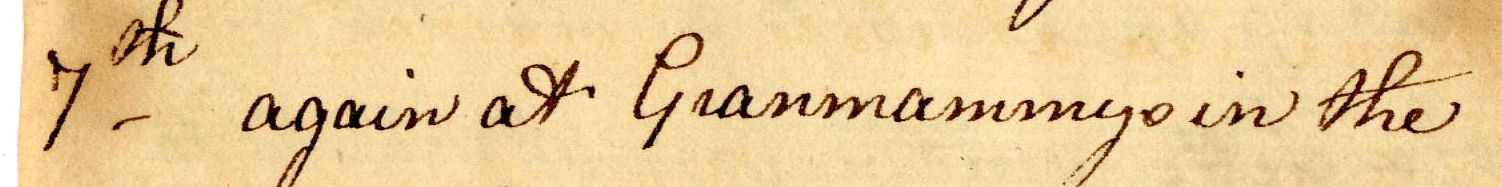7^th again at Granmammys in the
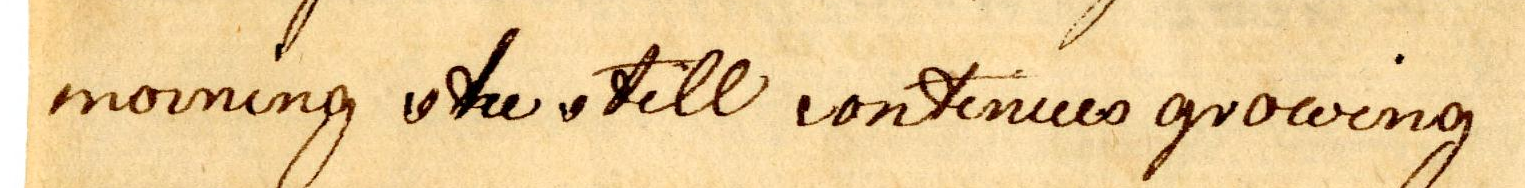morning she still continues growing
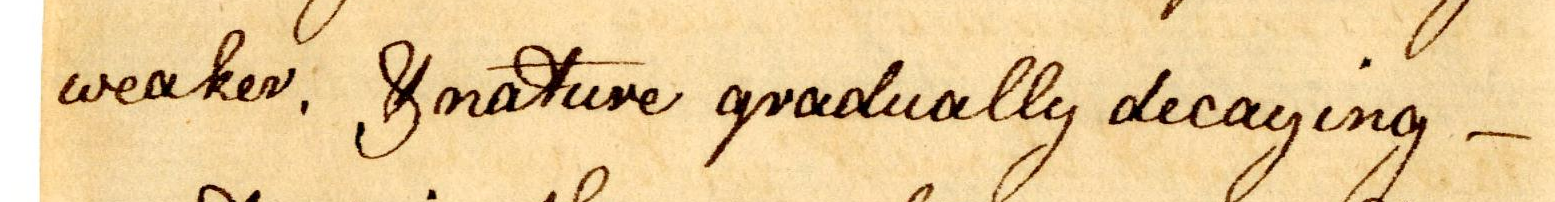weaker. & nature gradually decaying-
